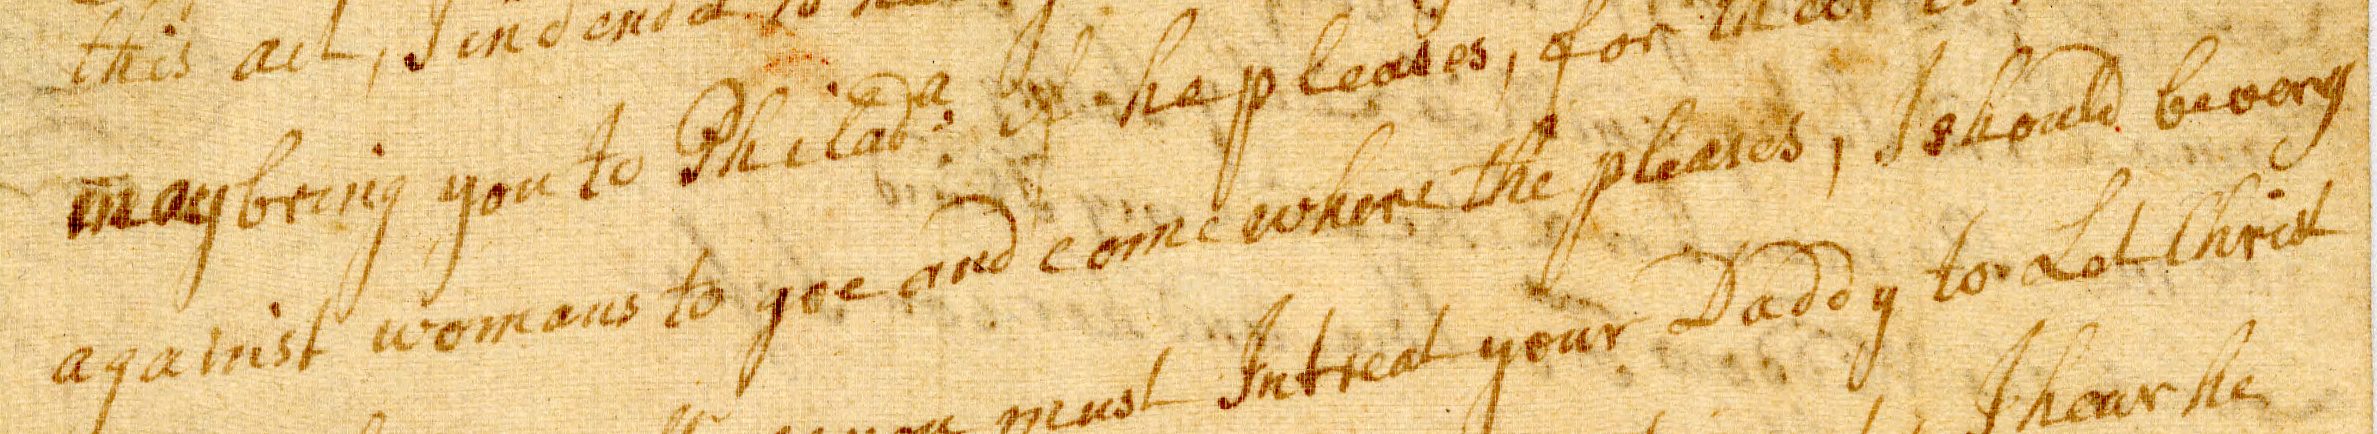against womans to goe an come where the pleaes, I should be very
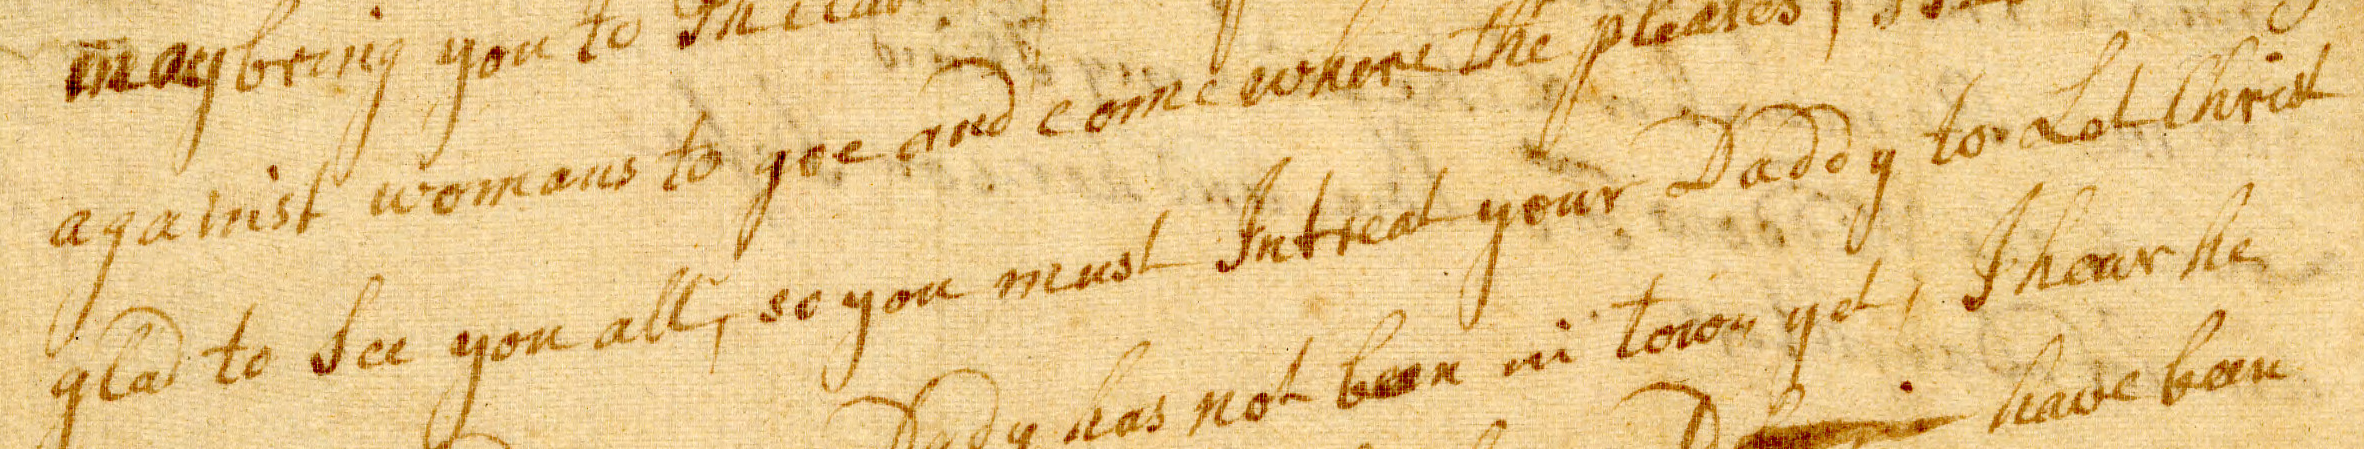glad to See you all, so you must Intreat your Daddy to Let Christ
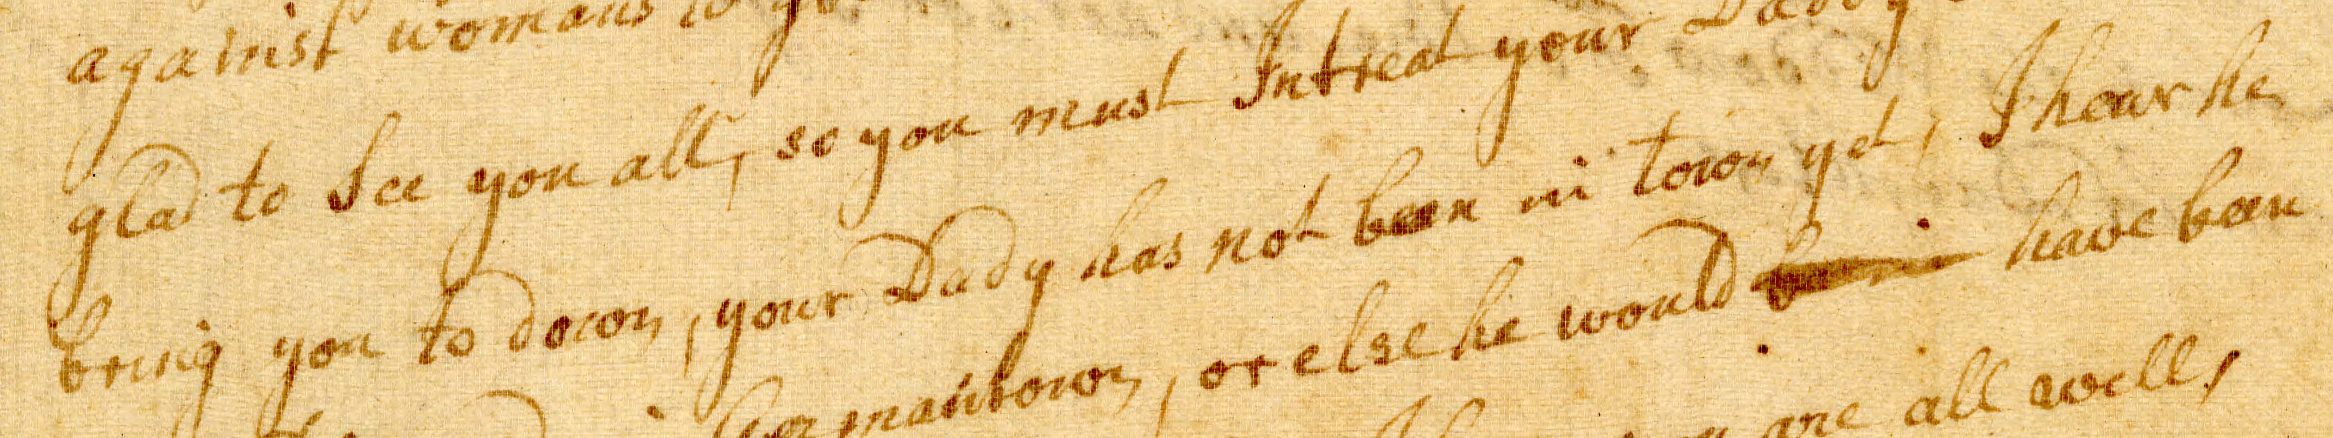bring you to down, your Dady has not been in town yet, I hear he
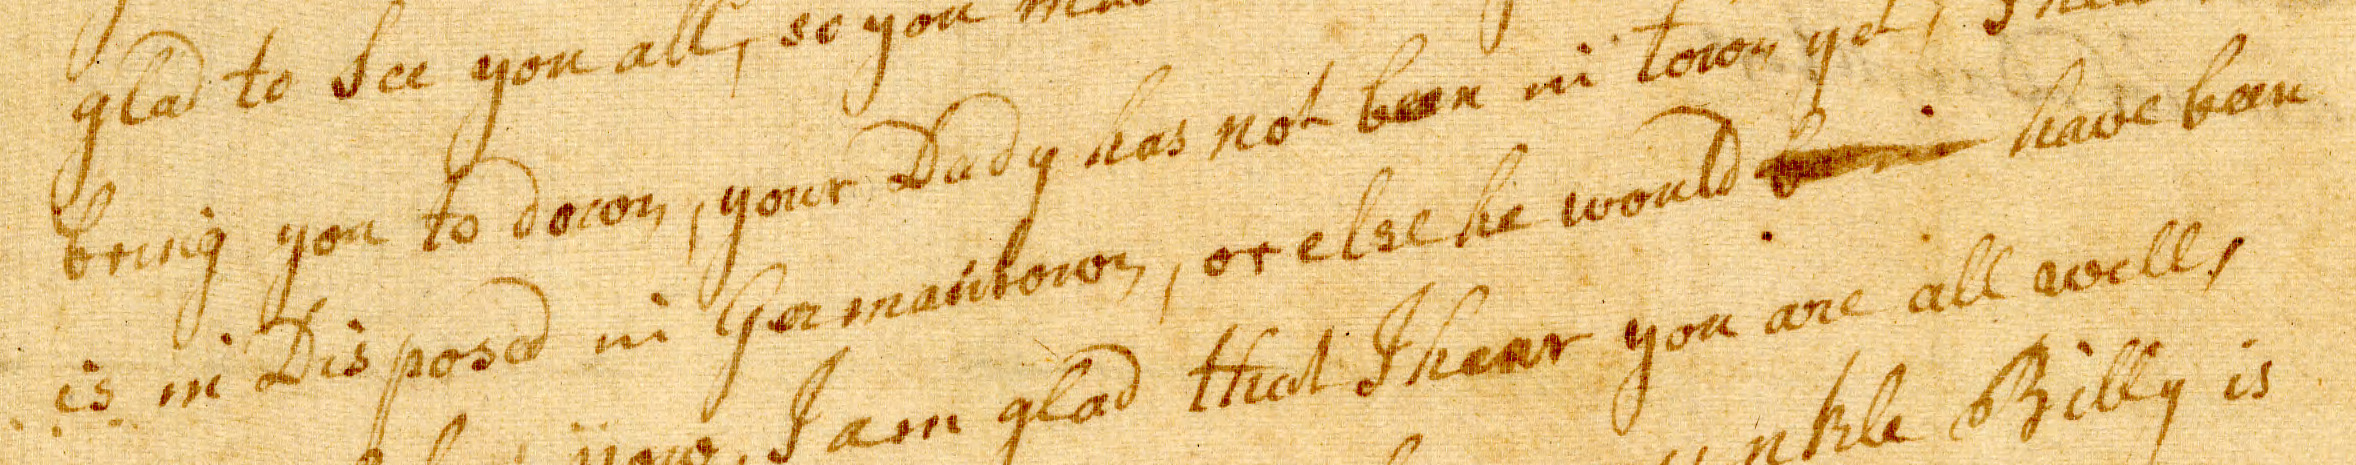is in Disposed in Germantown, or else he would have been
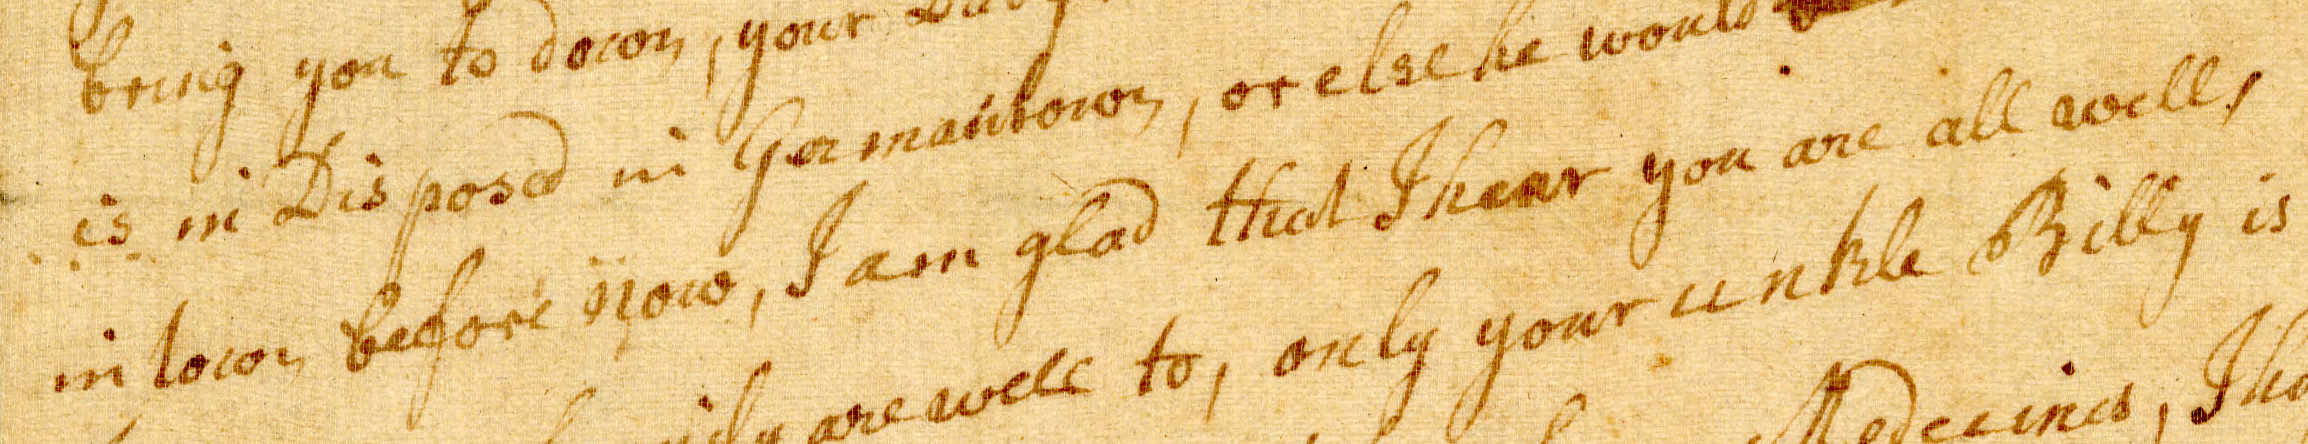in town before now, I am glad that I hear you are all well,
